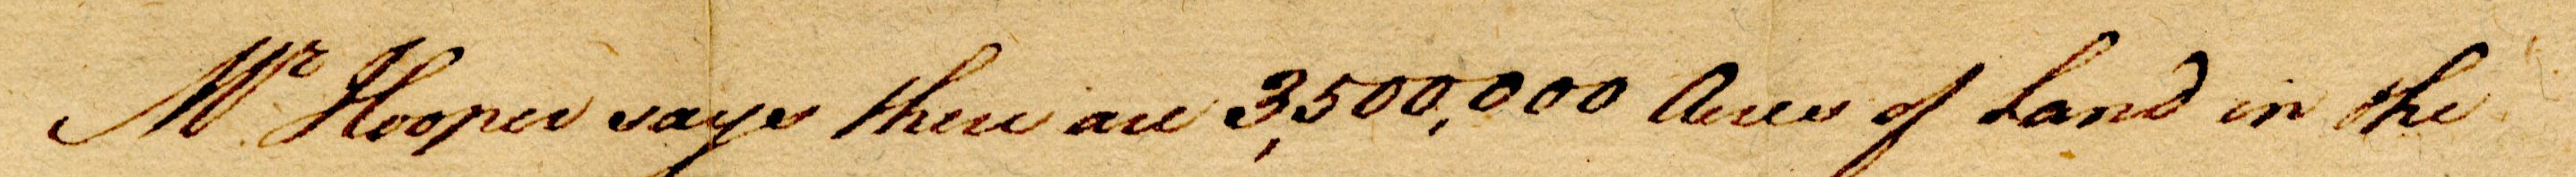M^r Hooper says there are 3,500,000 acres of Land in the
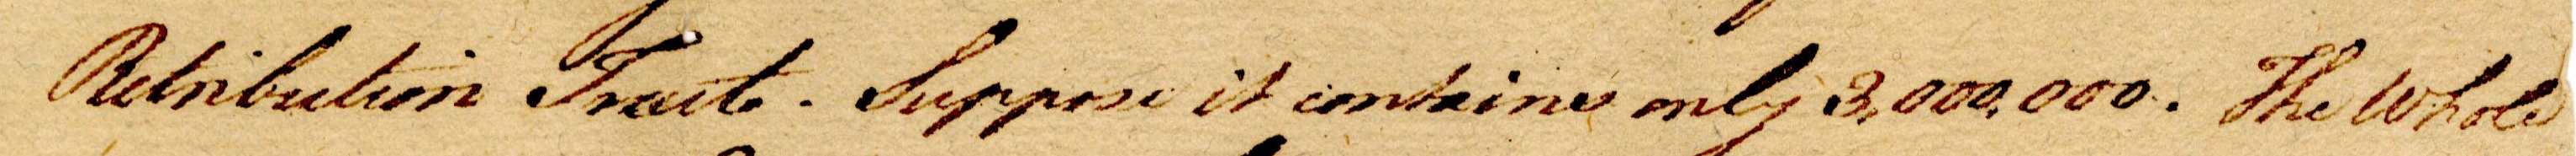Retribution Tract. Suppose it contains only 3,000000. The Whole
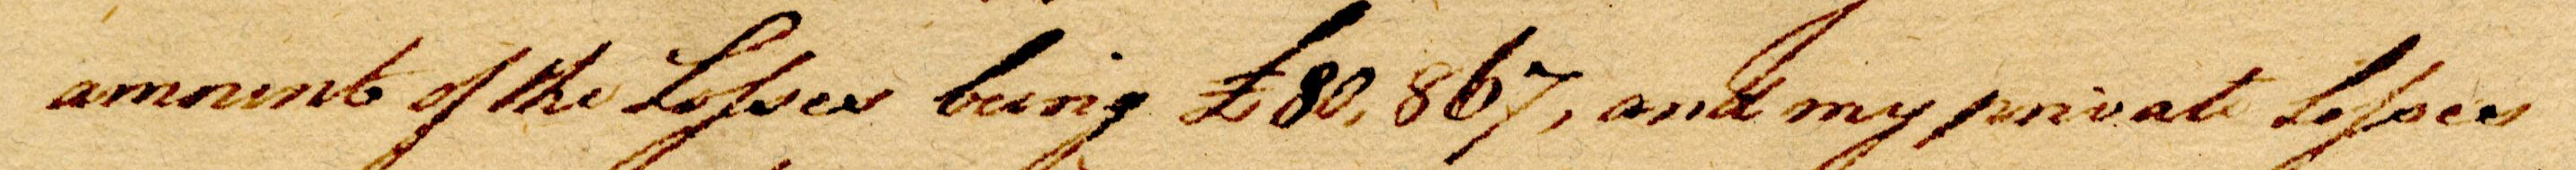amount of the losses being £80,867, and my private Losses
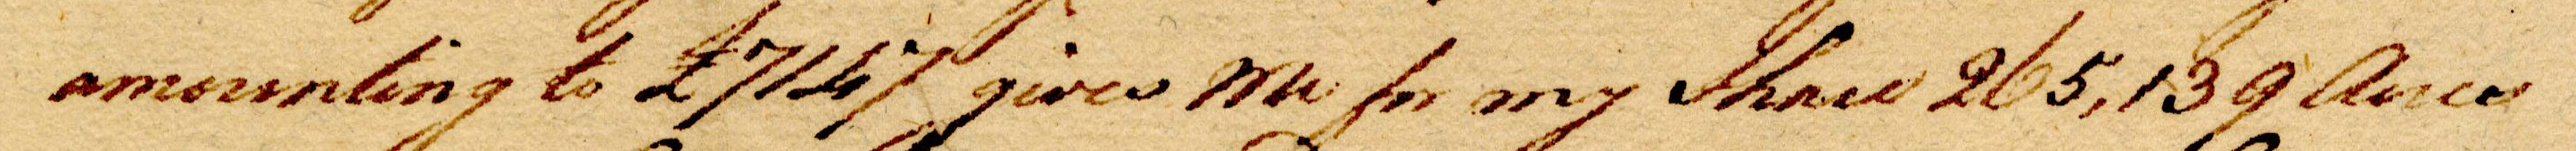amounting to £7147 gives me for my Share 265,139 acres
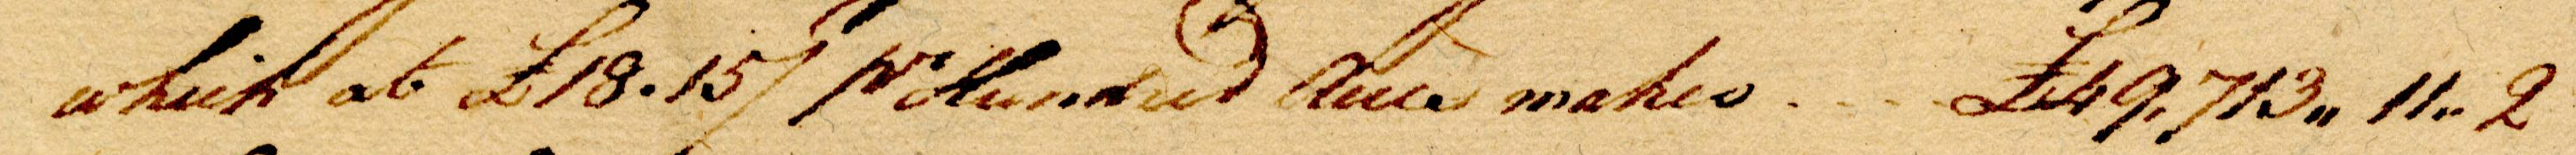which at £18.15s p^r Hundred acre makes... £49,713.11.2
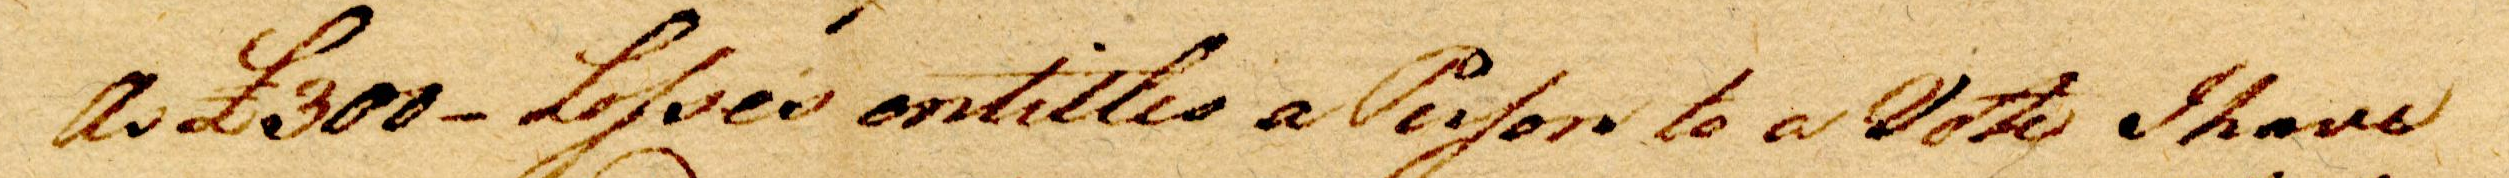As £300- Losses entitles a Person to a Vote I have
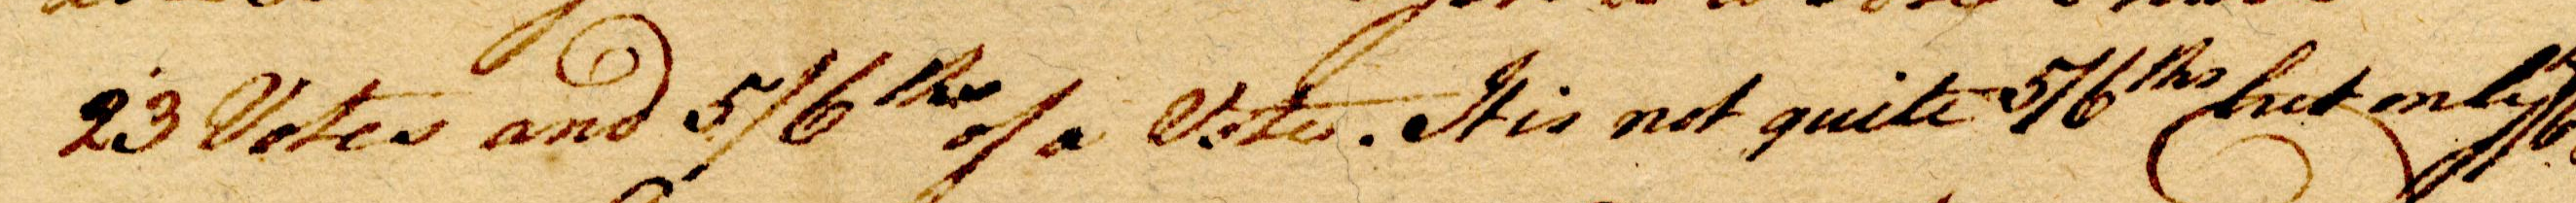23 votes and 5/6^th. of a vote. It is not quite 5/6^th yet only
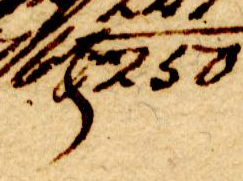& 250
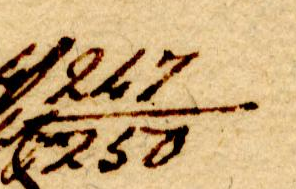247
